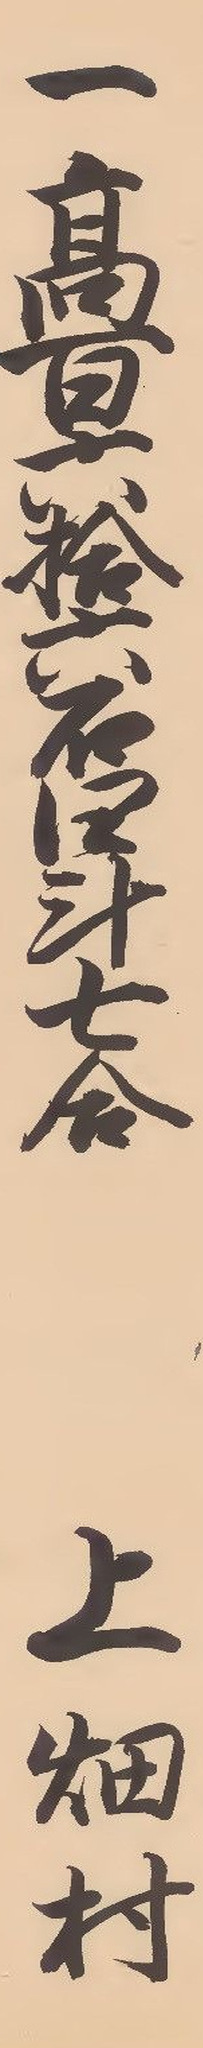一高百六拾六石四斗七合上畑村
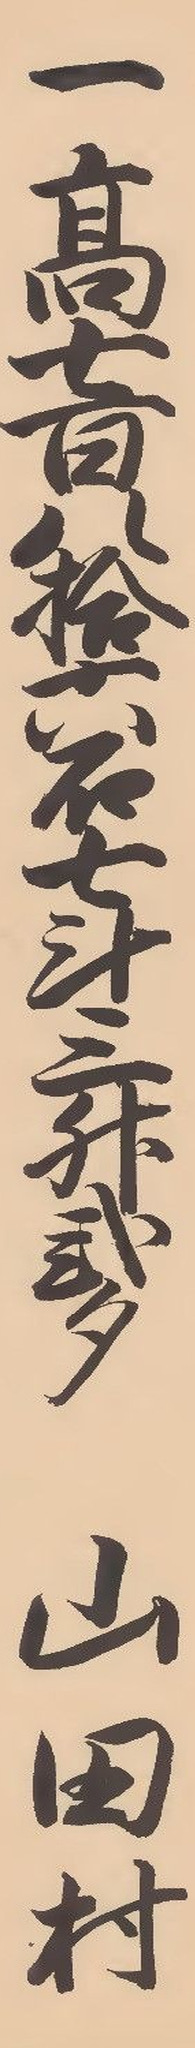一高七百八拾六石七斗三升弐勺山田村
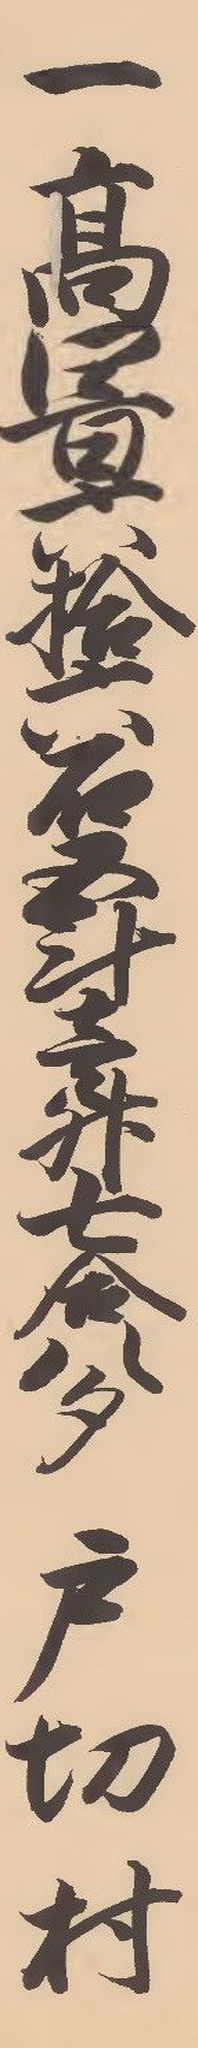一高四百六拾六石五斗壱升七合八勺戸切村
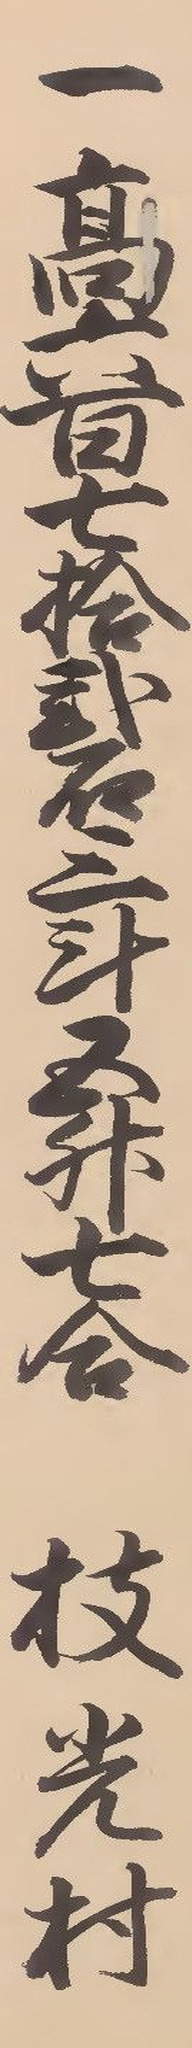一高六百七拾弐石三斗五升七合枝光村
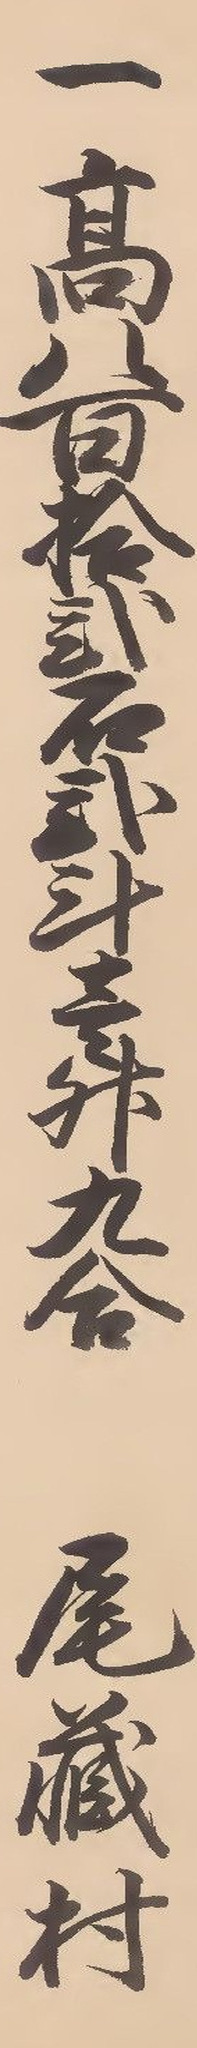一高八百拾弐石弐斗壱升九合尾蔵村
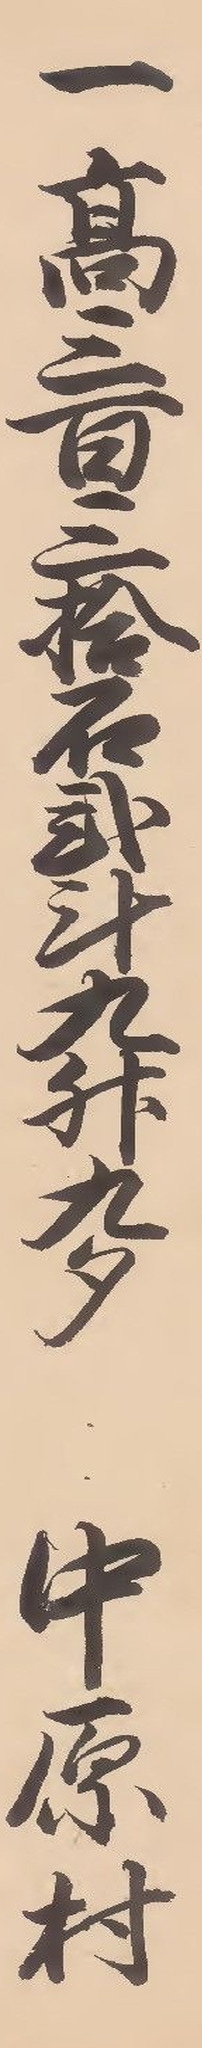一高三百三拾石弐斗九升九勺中原村
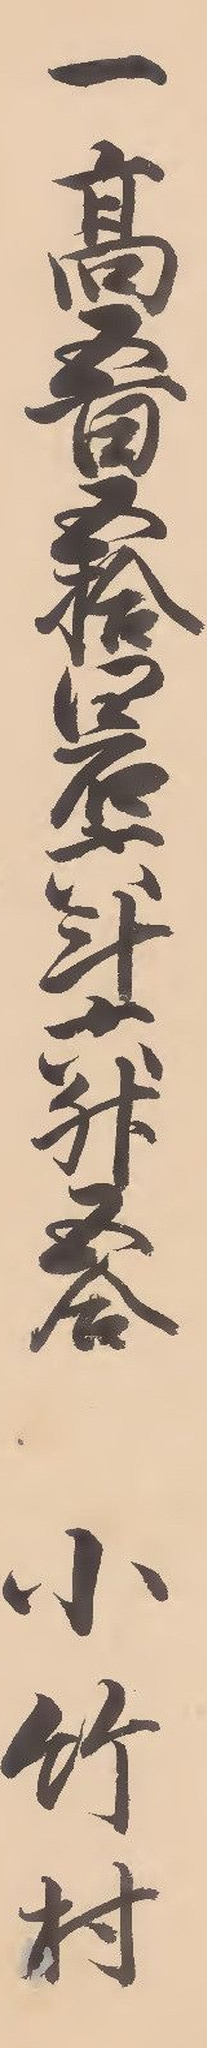一高五百五拾四石六斗六升五合小竹村

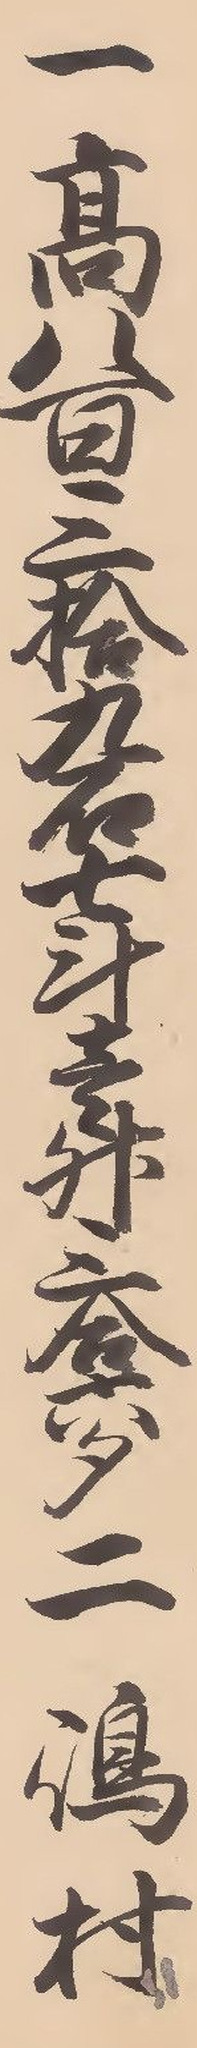一高八百三拾九石七斗壱升三合六勺二島村
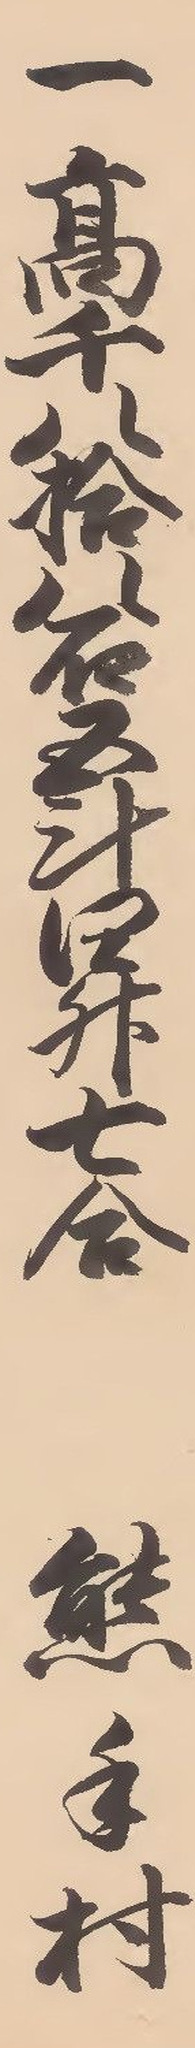一高千八拾八石五斗四升七合熊手村
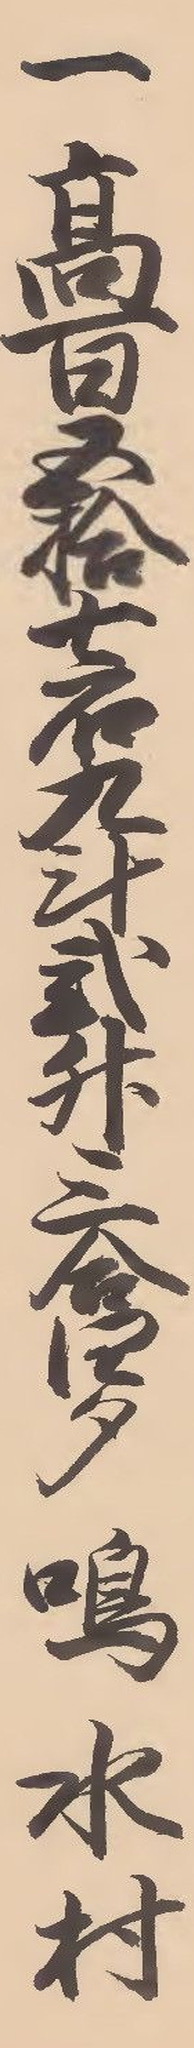一高百五拾七石九斗弐升三合四勺鳴水村
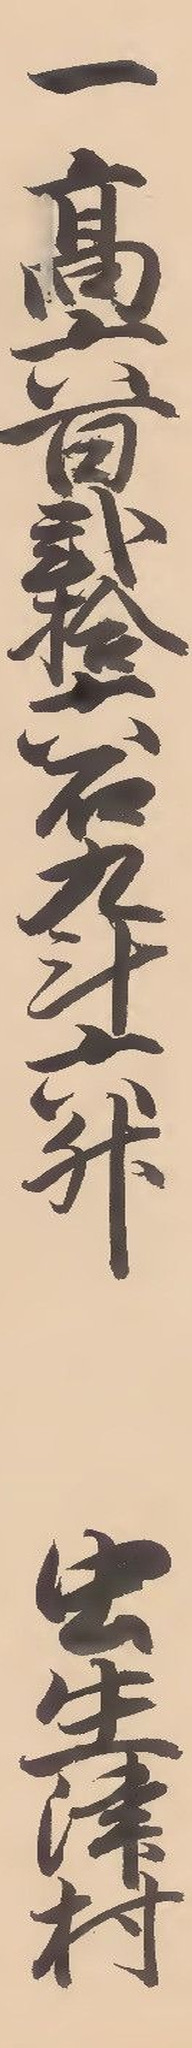一高六百弐拾六石九斗六升虫生津村
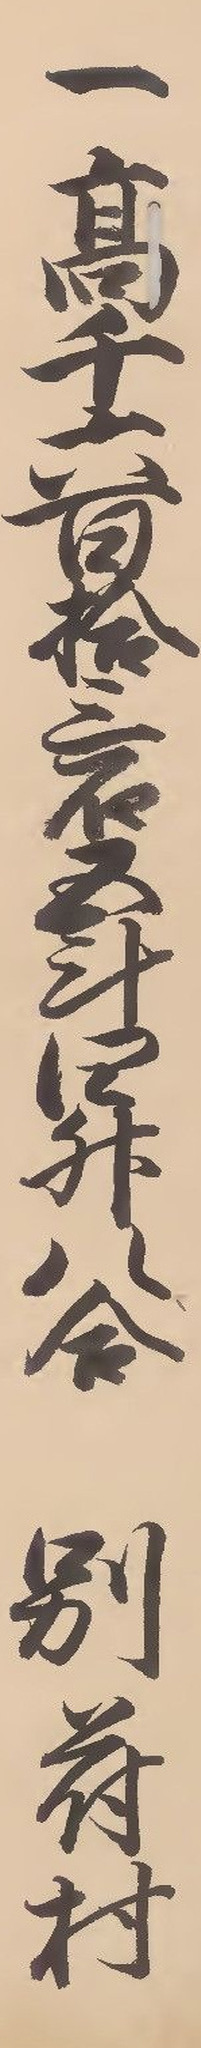一高千六百拾三石五斗四升八合別苻村
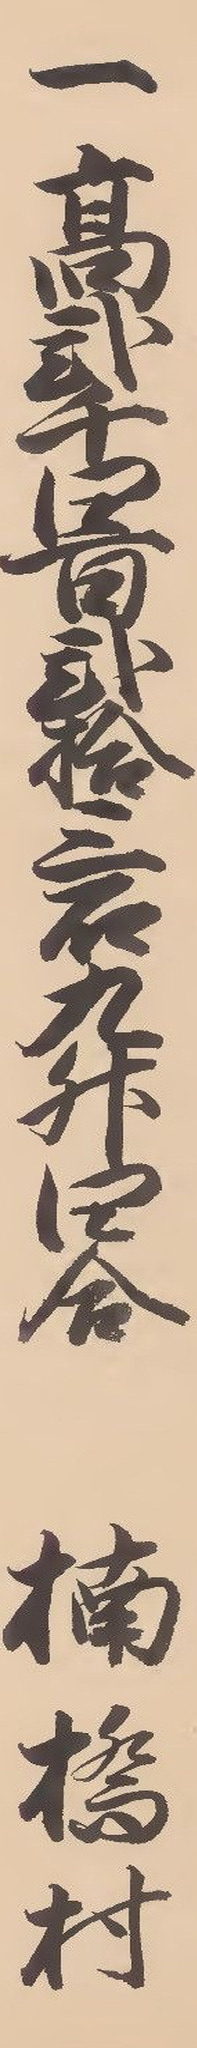一高弐千四百弐拾三石九升四合楠橋村
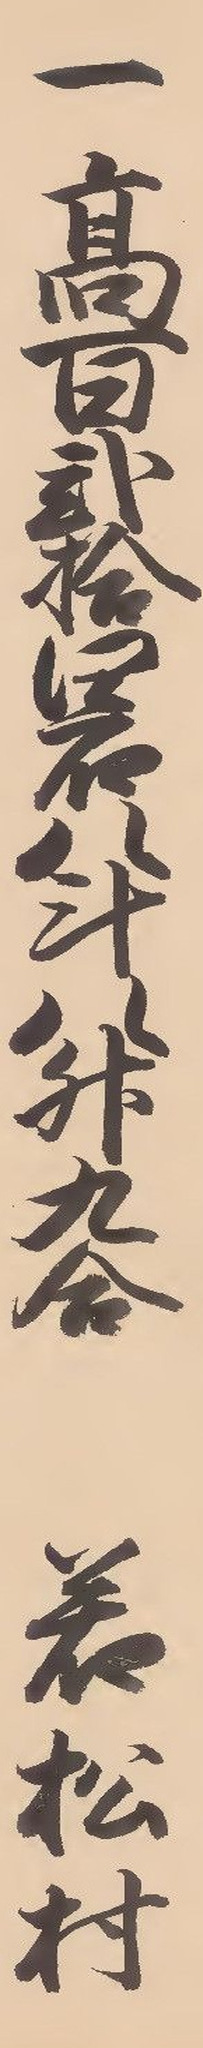一高百弐拾四石八斗八升九合若松村
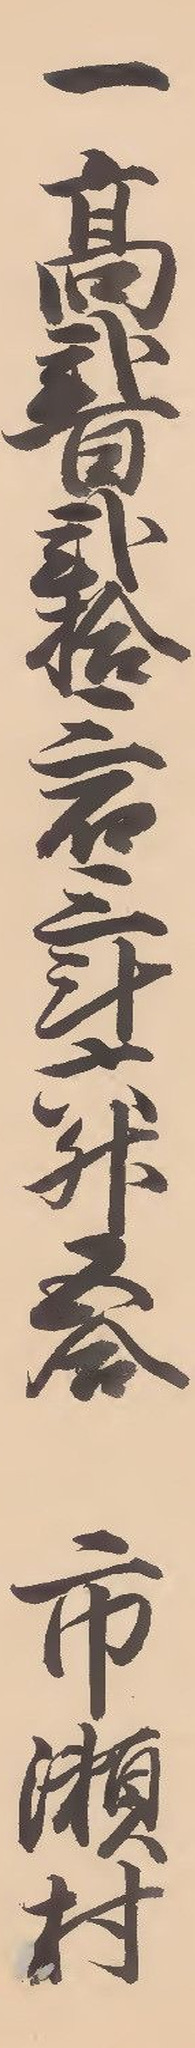一高弐百弐拾三石三斗六升五合市瀬村

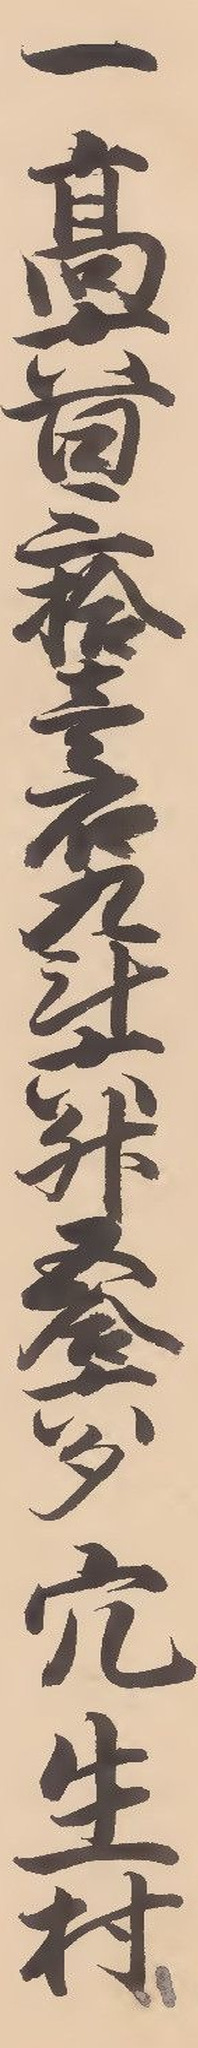一高六百三拾壱石九斗六升五合六勺穴生村
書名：筑前国郷帳
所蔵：国立公文書館 National Archives of Japan
